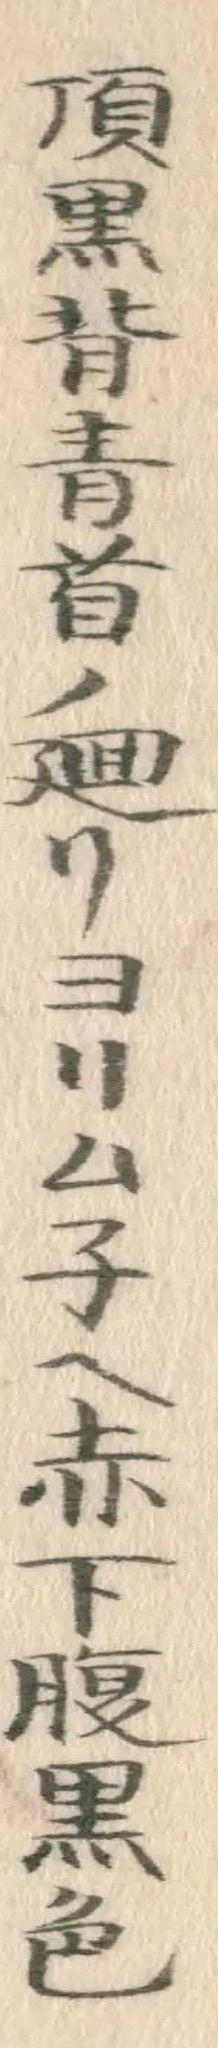頂黒背青首ノ廻リヨリムネヘ赤下腹黒色
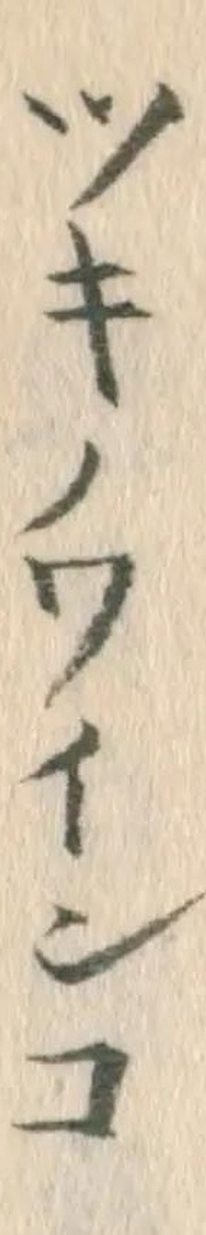ツキノワインコ
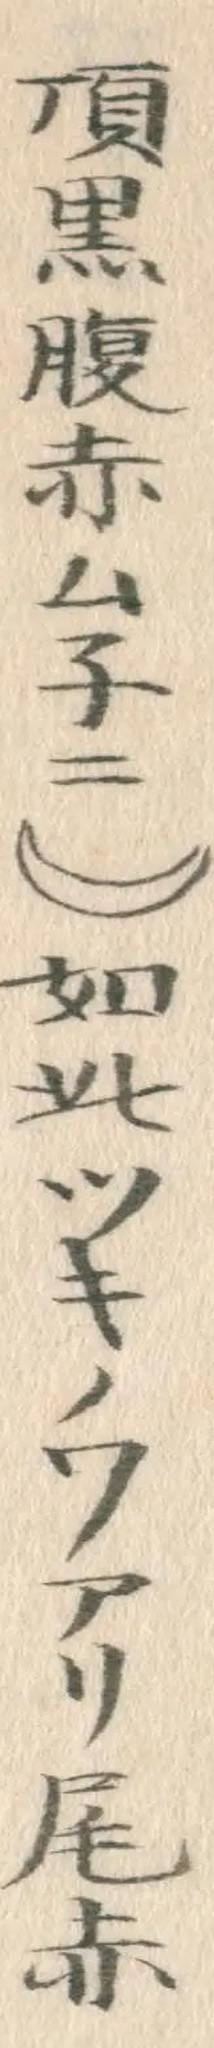頂黒腹赤ムネニ如此ツキノワアリ尾赤
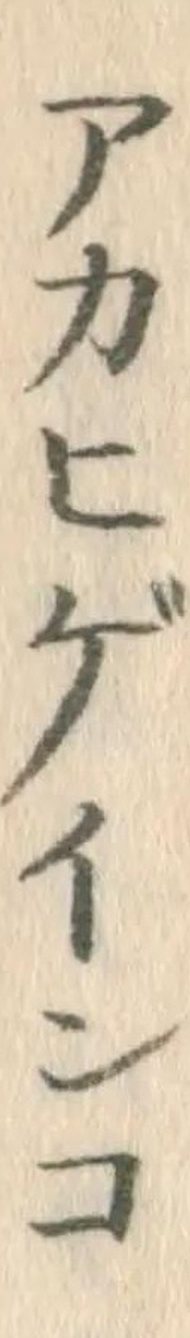アカヒゲインコ
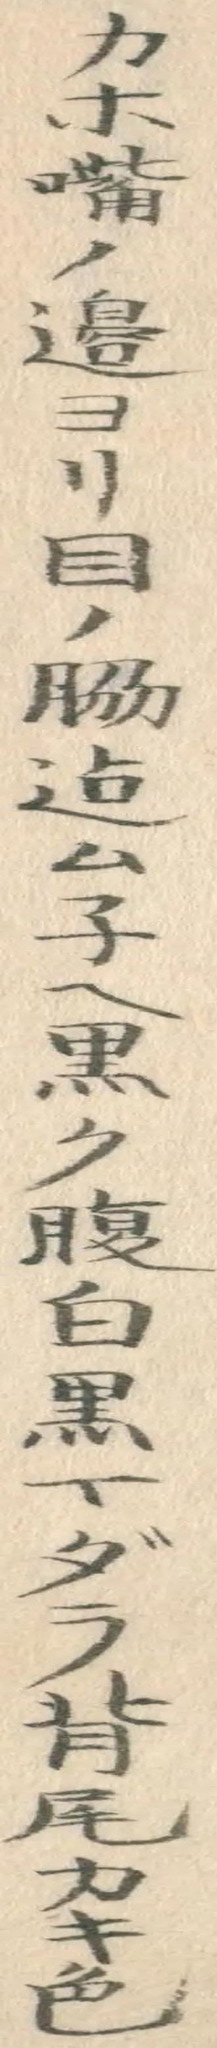カホ嘴ノ辺ヨリ目ノ脇迄ムネヘ黒ク腹白黒マダラ背尾カキ色

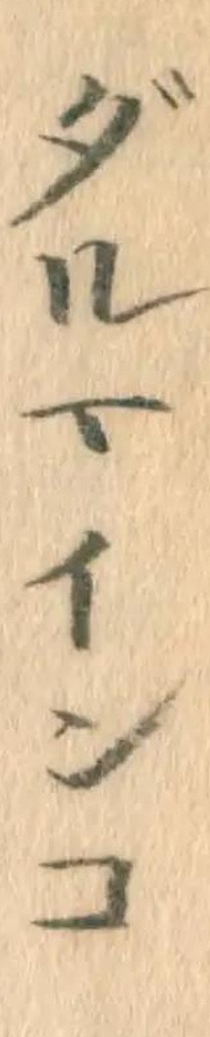ダルマインコ
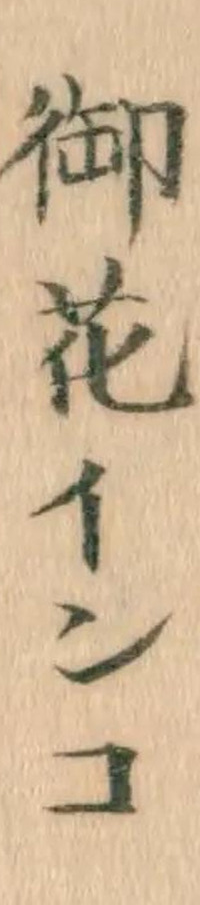御花インコ
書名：水谷禽譜. [1]
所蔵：国立国会図書館 National Diet Library, JAPAN
